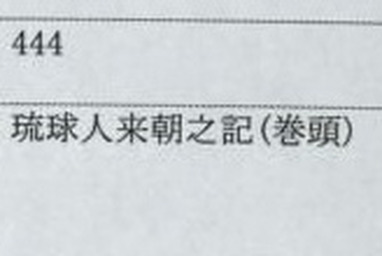琉球人来朝記全

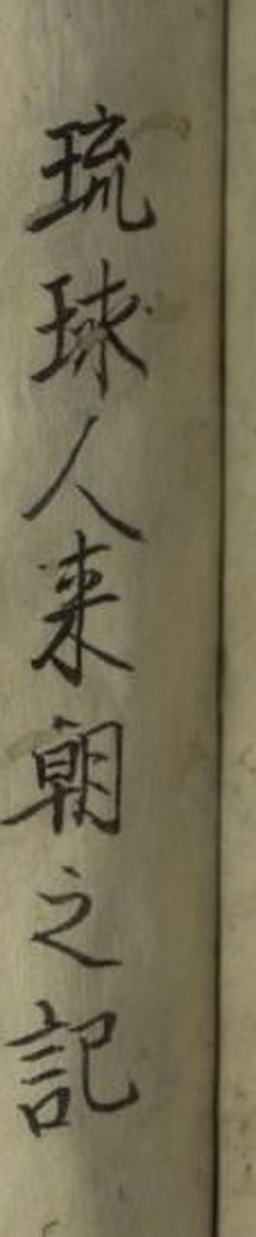琉球人来朝之記
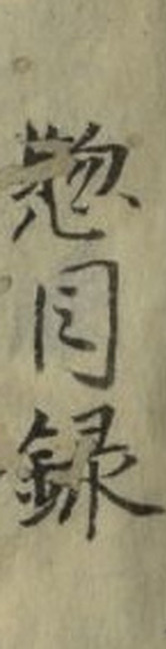惣目録
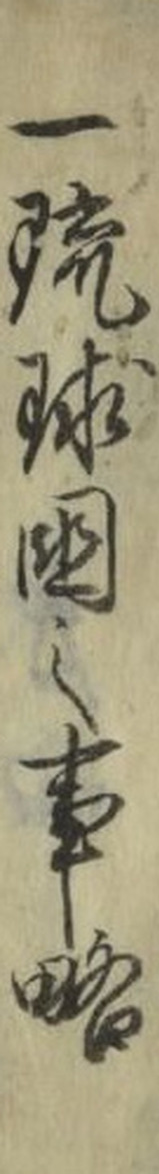一琉球国之事略
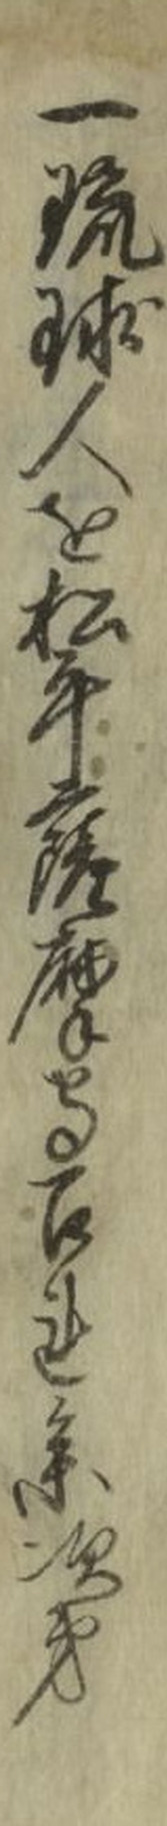一琉球人を松平薩摩守召連參次第
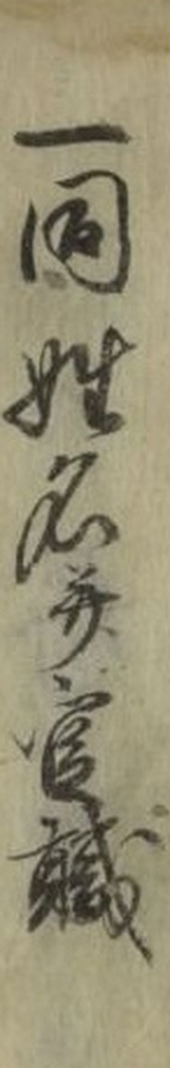一同姓名幷官職
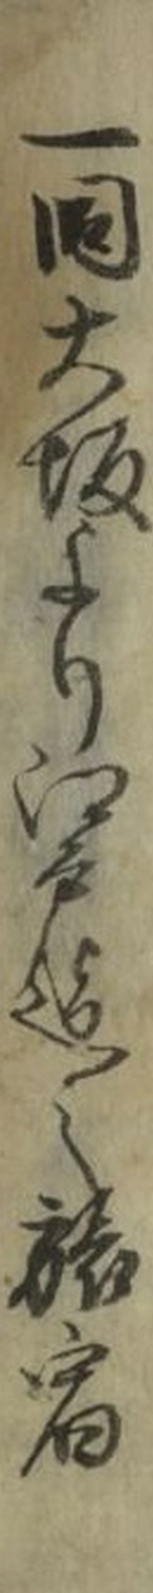一同大坂より江戸迠之旅宿

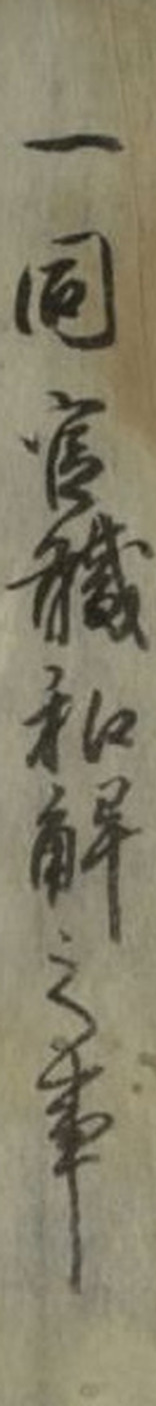一同官職和解之事
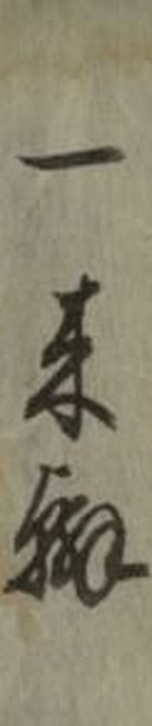一来翰
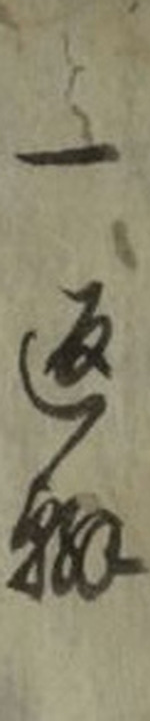一返翰
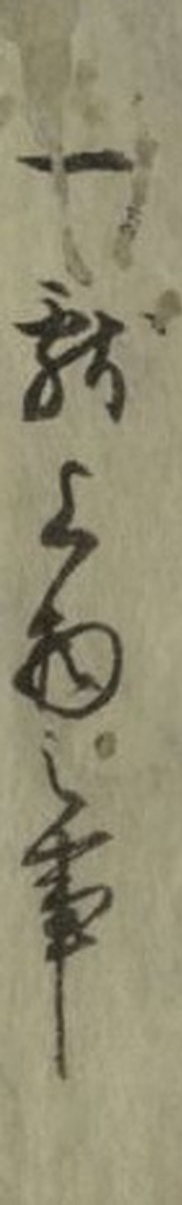一献上物之事
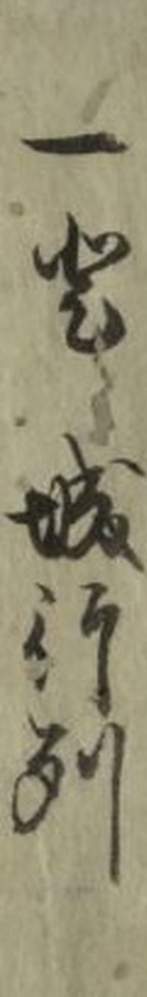一登城行列
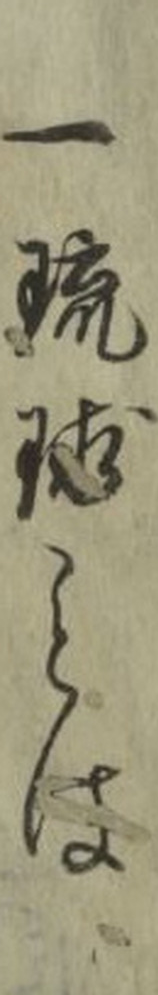一琉球ことは
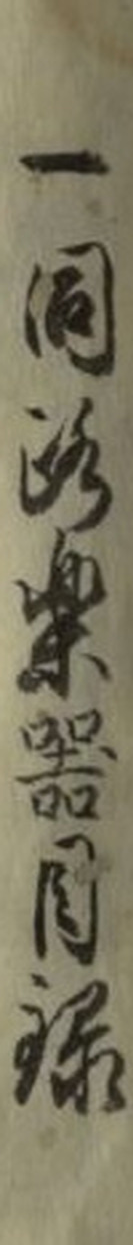一同路楽器目録
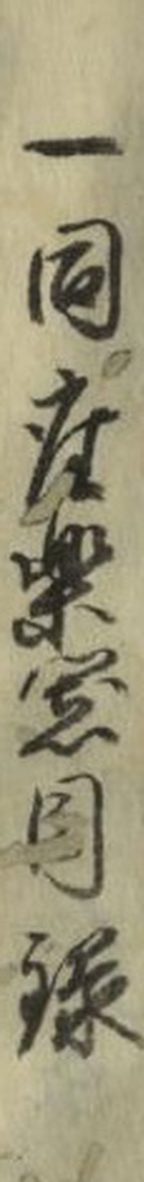一同座楽器目録
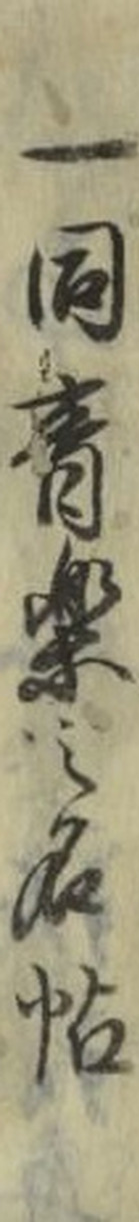一同音楽之名帳
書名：琉球人来朝之記
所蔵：University of the Ryukyus Library
